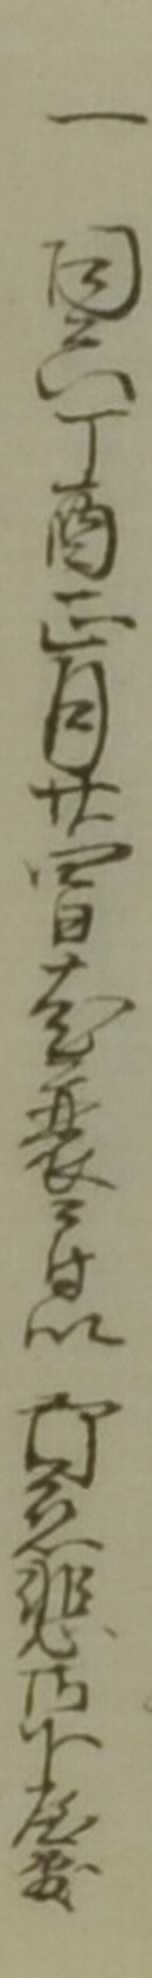一同六丁酉正月廿四日老衰ニ付以御慈悲御下屋敷
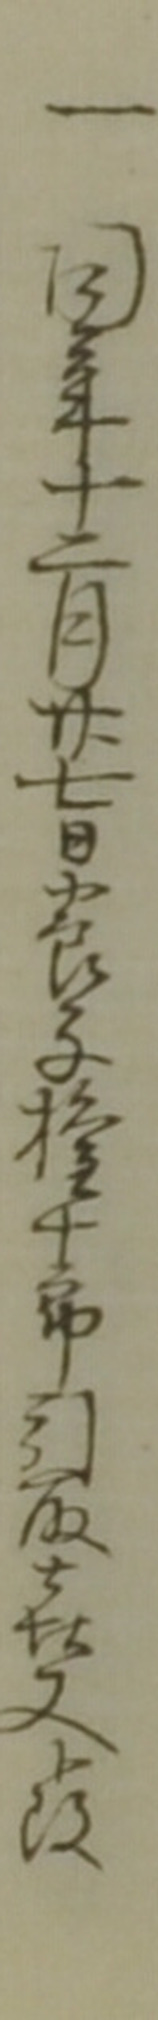一同年十二月廿七日養子権十郎引取喜又改
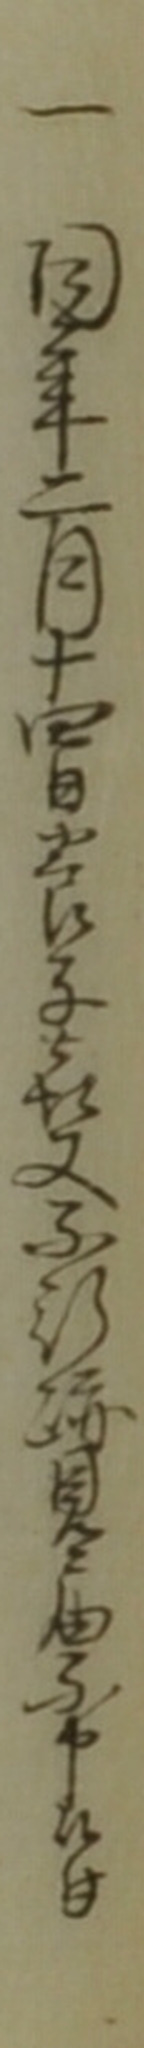一同年二月十四日養子喜又不行跡見届不申候付
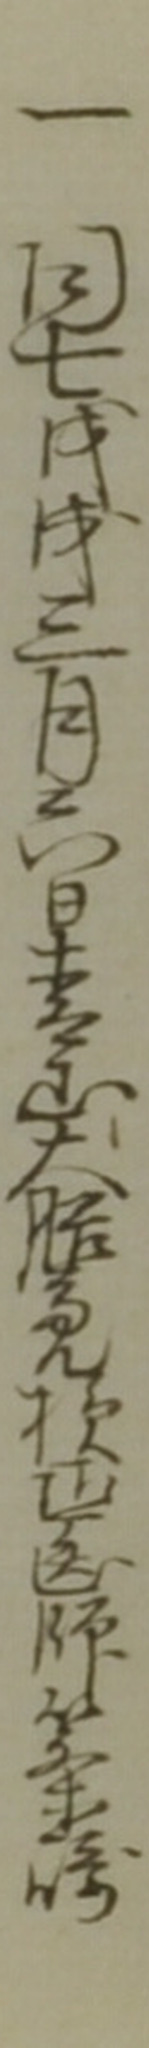一同七戊戌三月六日青山大膳亮様御医師篠碕
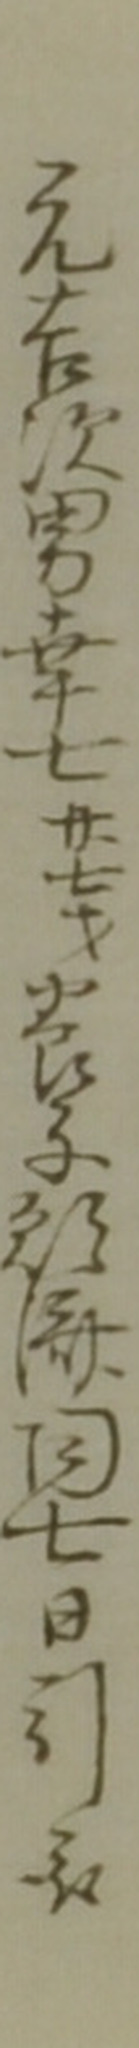元吉次男幸七廿七才養子願済同七日引取
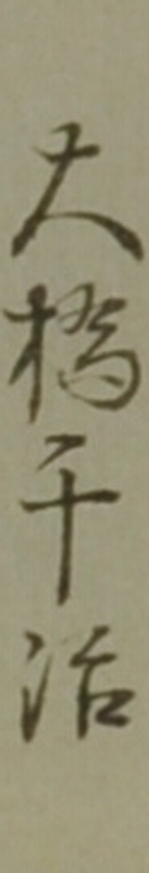大橋千治
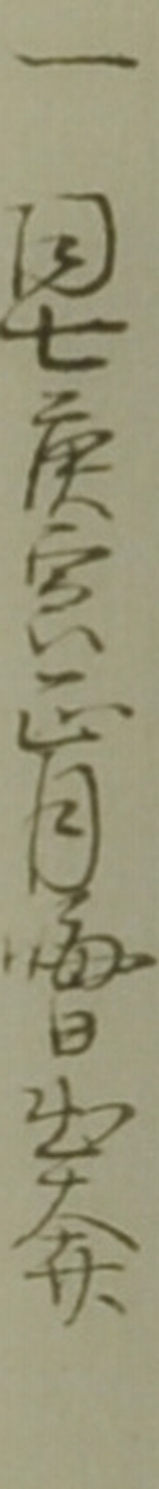一同七庚寅正月晦日出奔

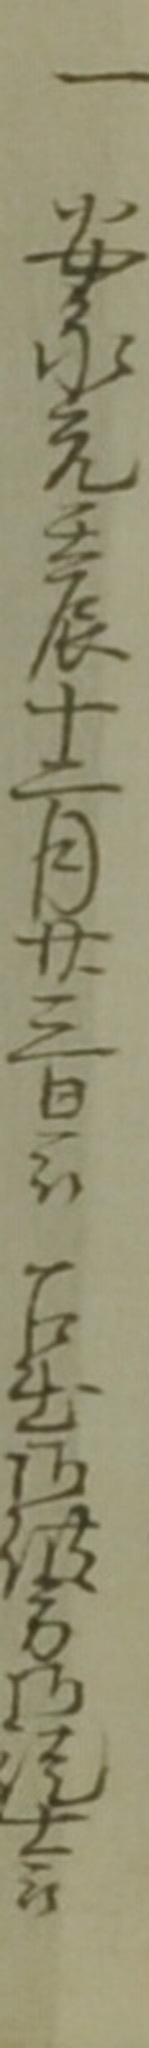一安永元壬辰十二月廿三日被召出御供方御徒士被
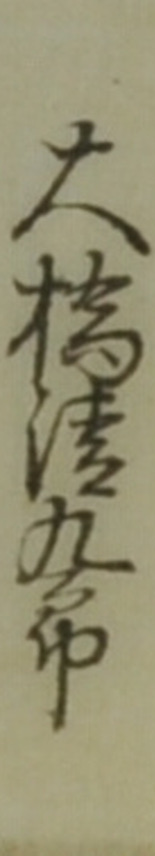大橋清九郎
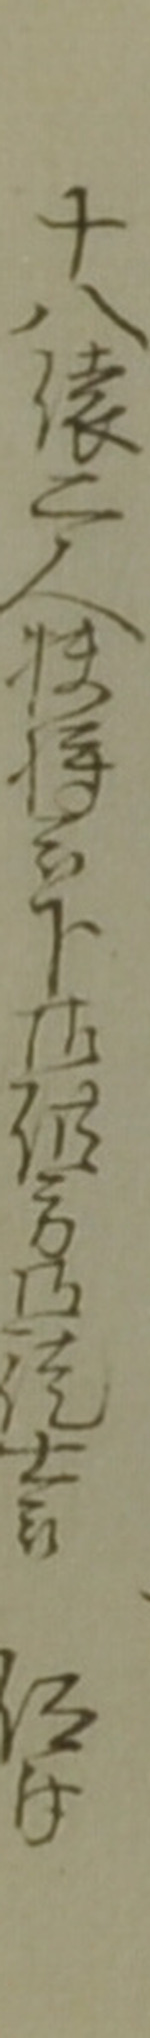十八俵二人扶持被下御供方御徒士被仰付
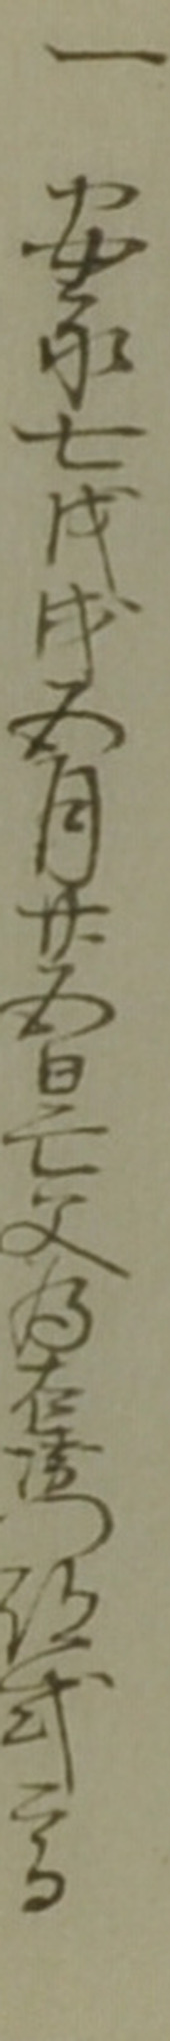一安永七戊戌五月廿五日亡父為右衛門跡式高
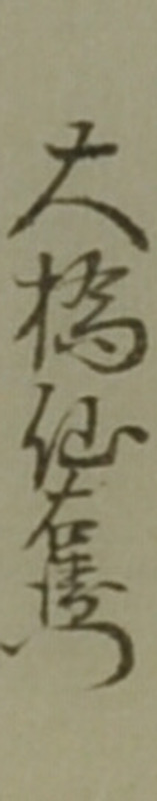大橋仙右衛門
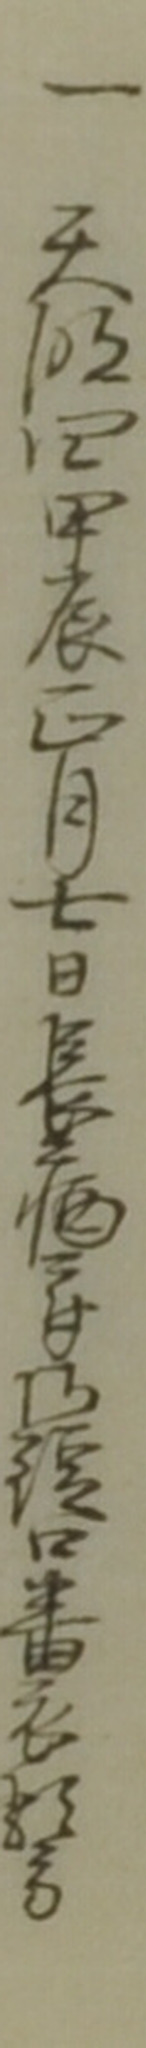一天明四甲辰正月七日長病ニ付御錠口番衣類方
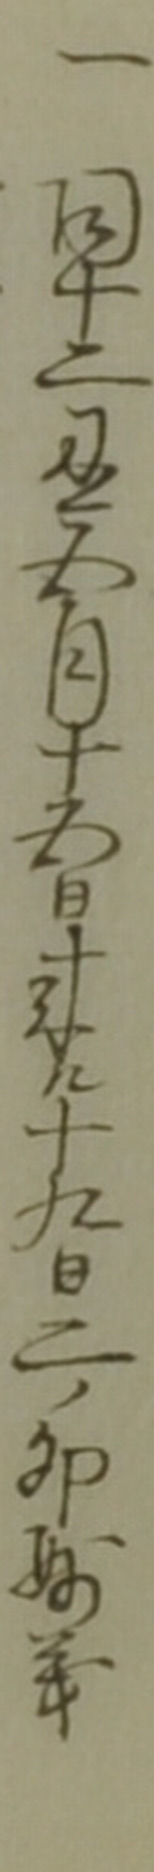一同十二丑五月十五日来十九日二卯妙義
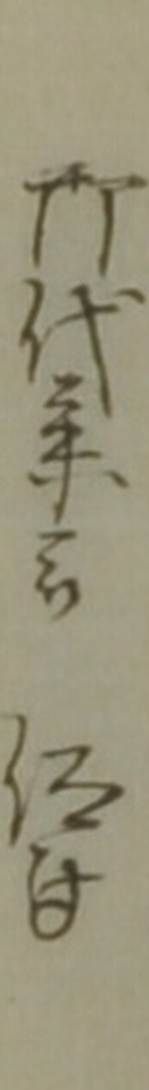御代参被仰付
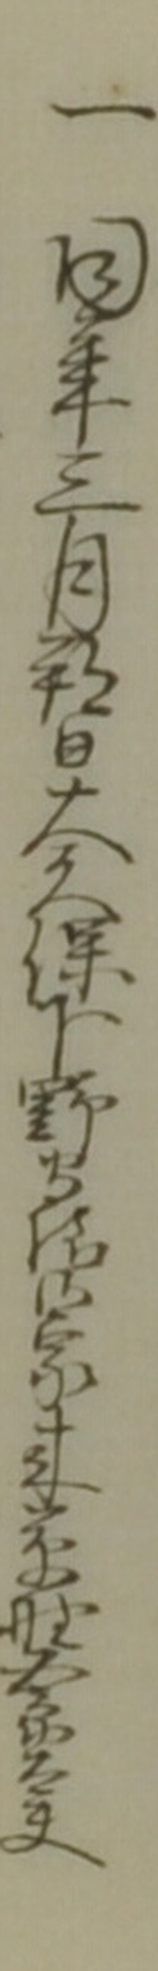一同年三月朔日大久保下野守様御家来草野五郎太夫
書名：無足廃家（弐）
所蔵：伊那市立高遠町図書館・合同会社AMANE
